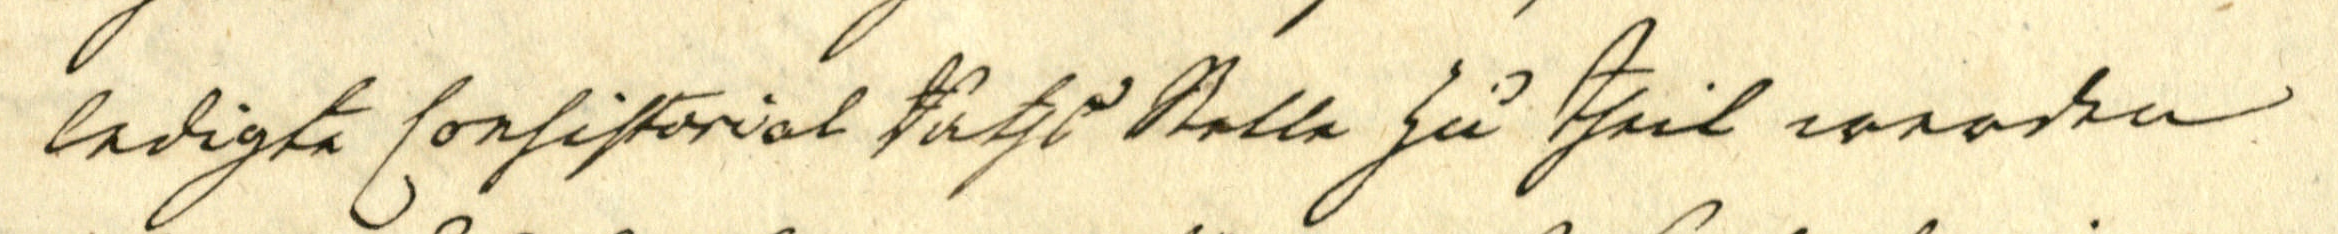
ledigte Consistorial Raths Stelle zu Theil werden
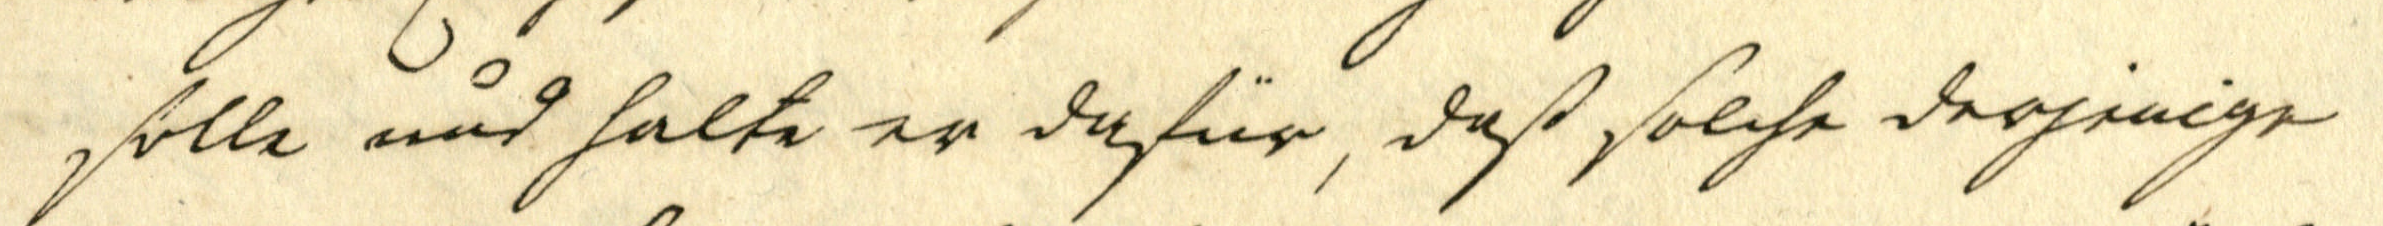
solle und halte er dafür, daß solche derjenige
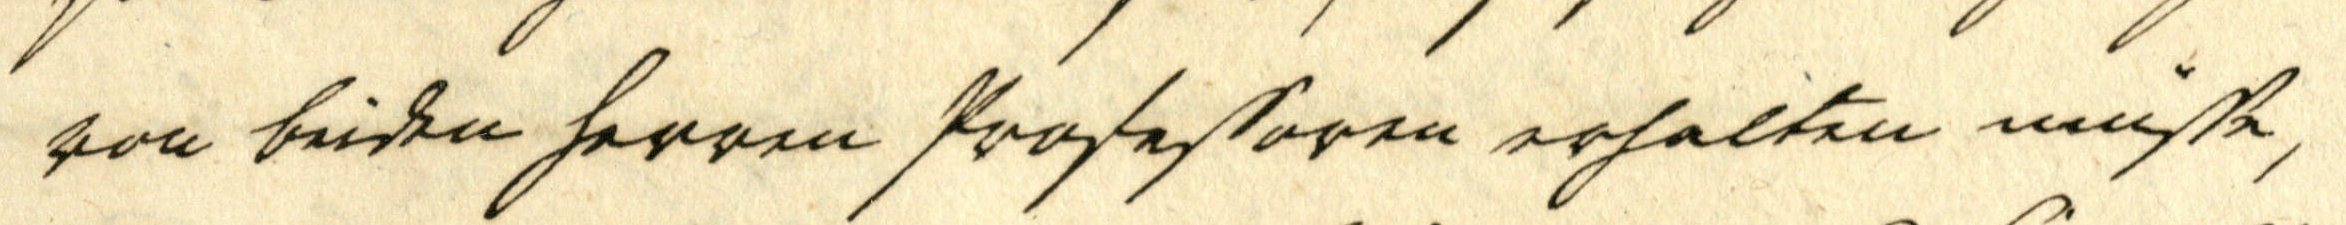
von beiden herren Professoren erhalten müsse,
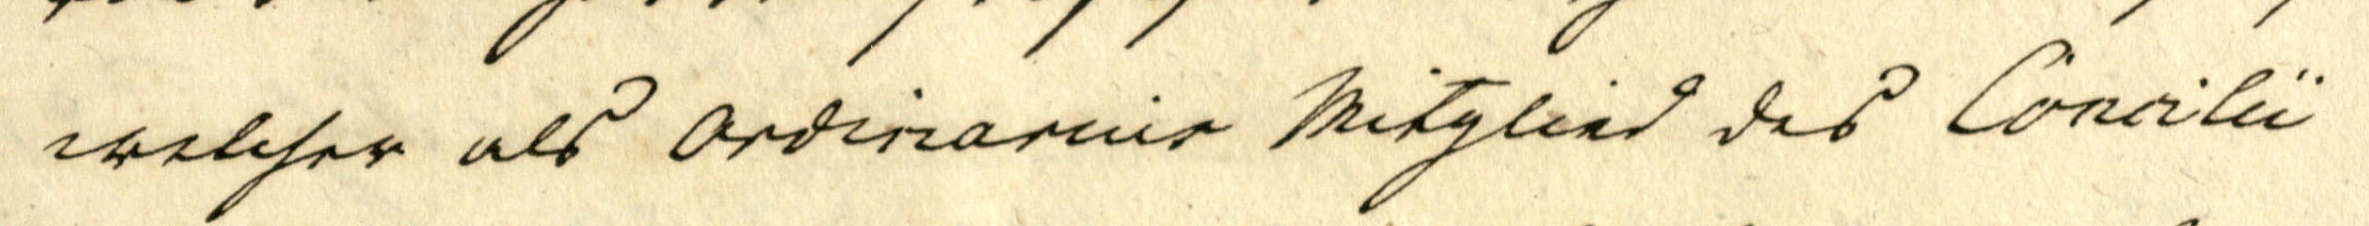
welcher als ordinarius Mitglied des Concilii
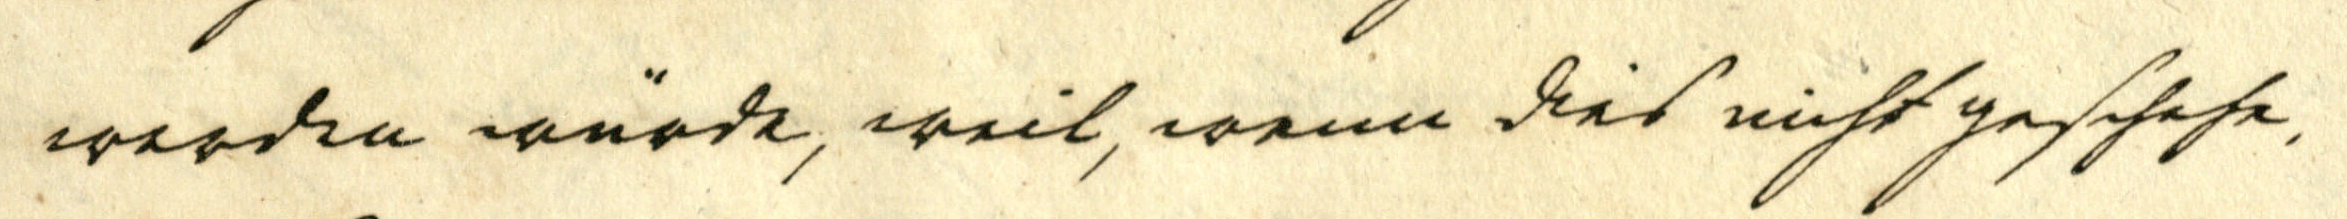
werden würde, weil, wenn dies nicht geschehe,
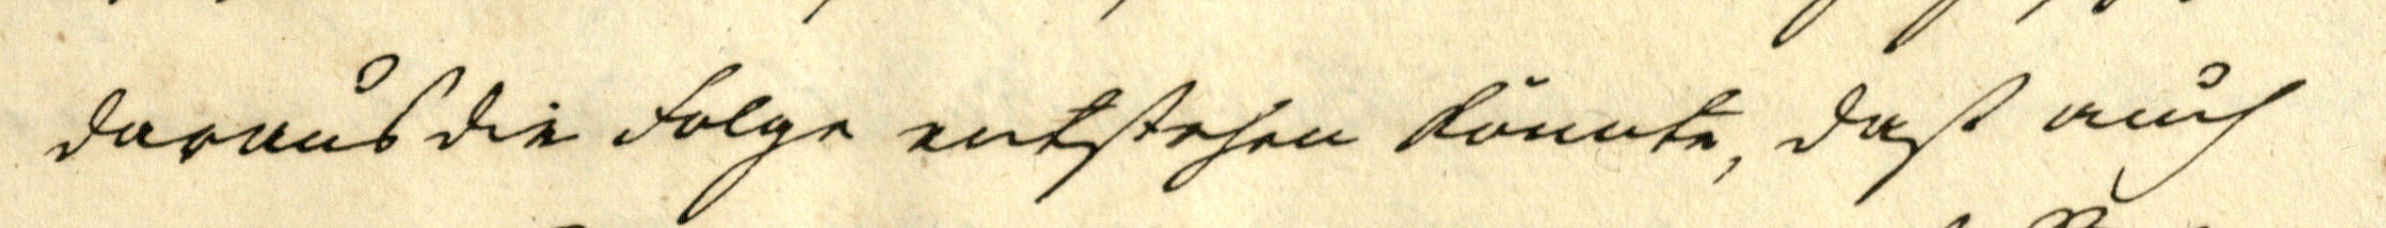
daraus die Folge entstehen könnte, daß auch
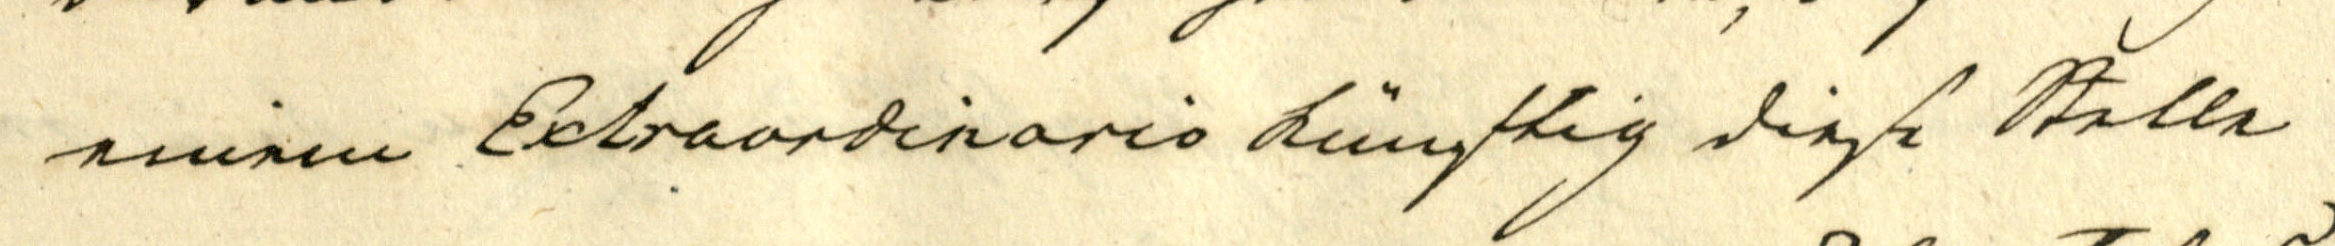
einem Extraordinario künftig diese Stelle
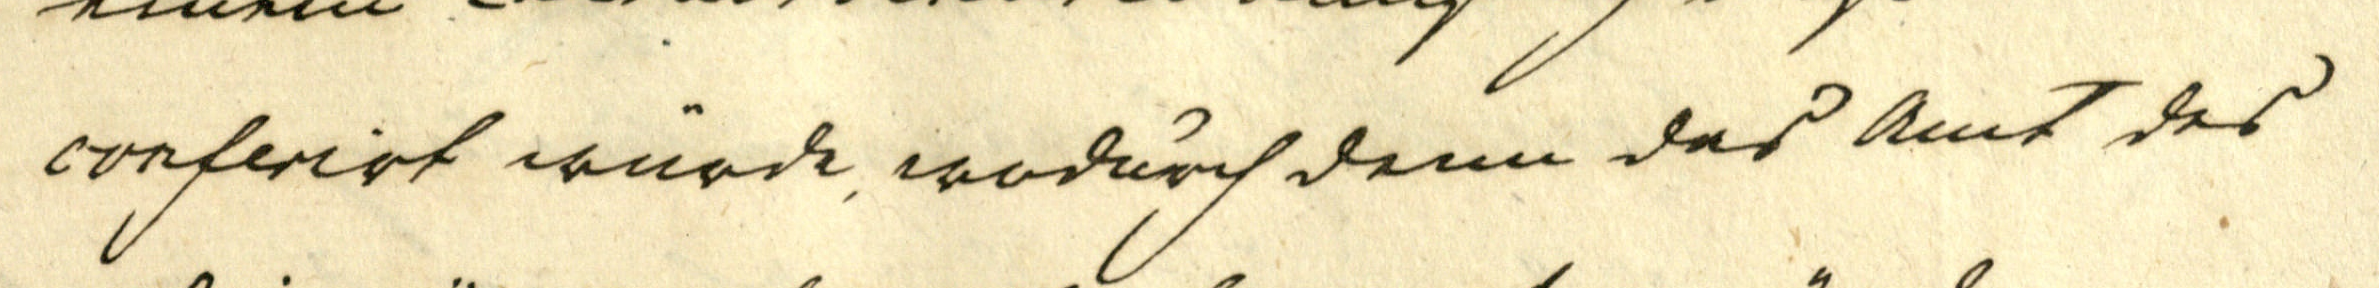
conferirt würde, wodurch denn das Amt des
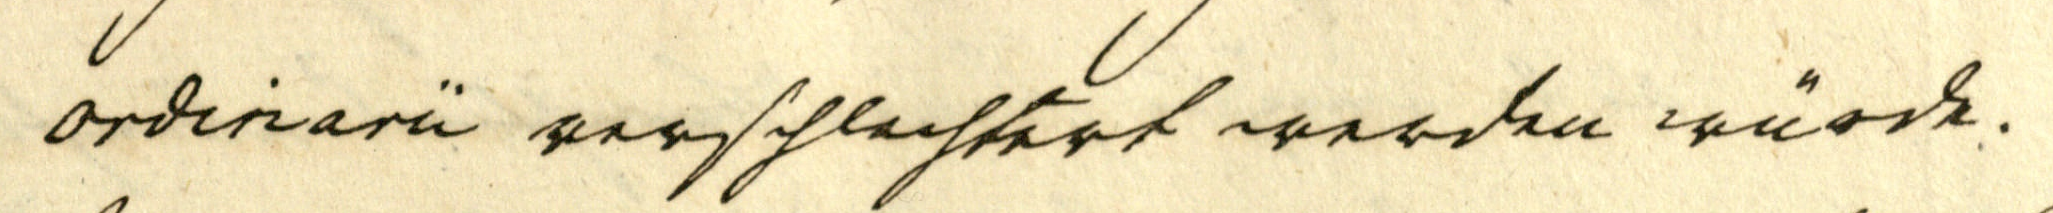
ordinarii verschlechtert werden würde.
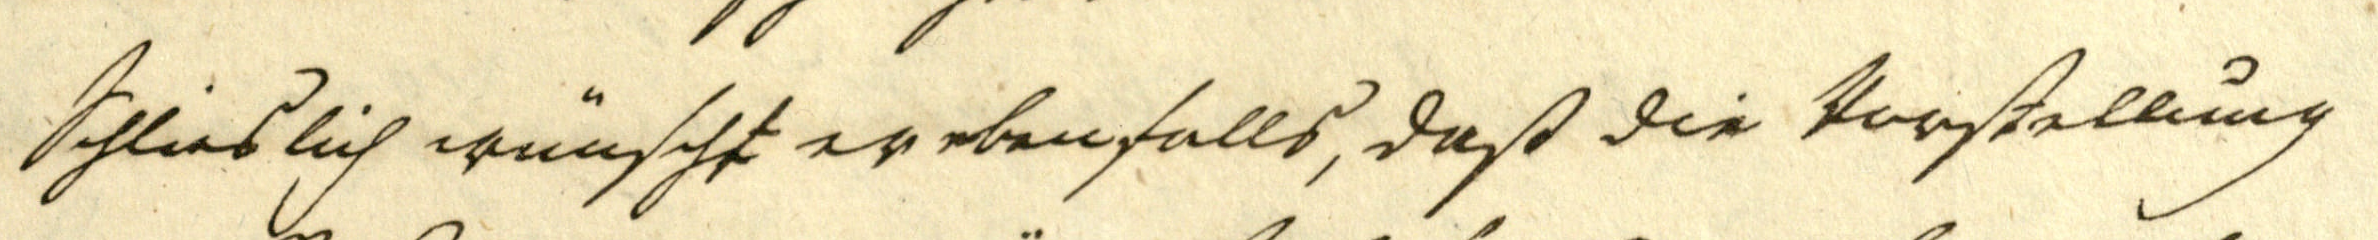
Schlieslich wünscht er ebenfalls, daß die Vorstellung
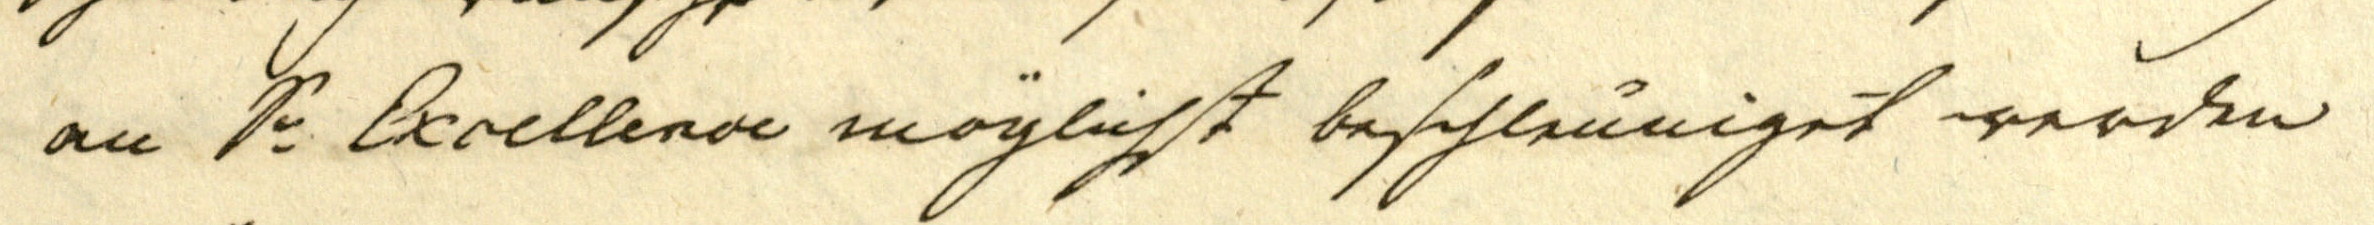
an Sr. Excellence möglichst beschleuniget werden
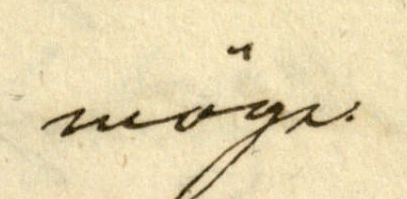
möge.
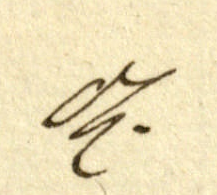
dh.
